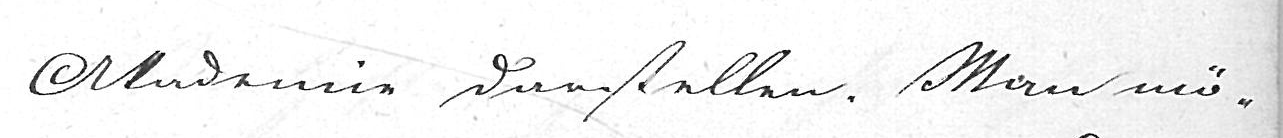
Akademie darstellen. Man mö-
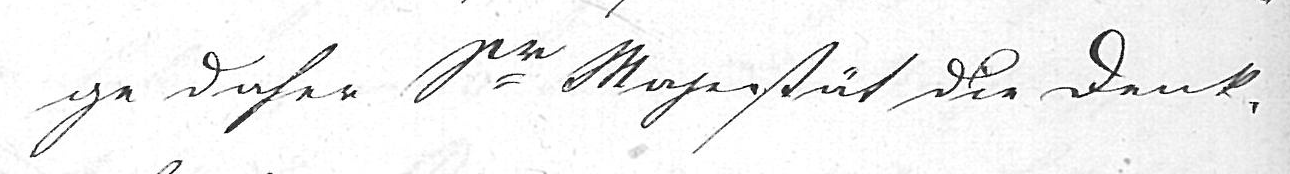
ge daher Sr Majestät die Denk-
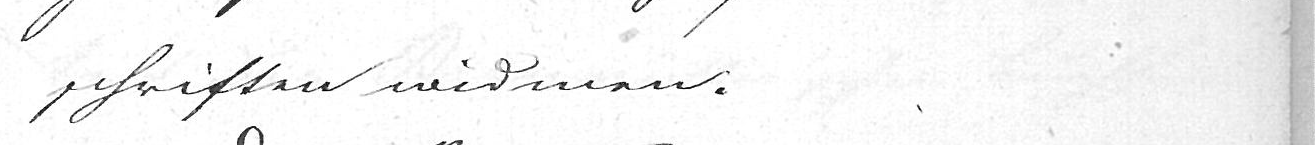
schriften widmen.
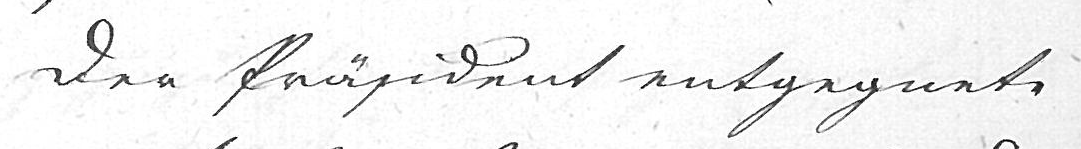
Der Präsident entgegnete
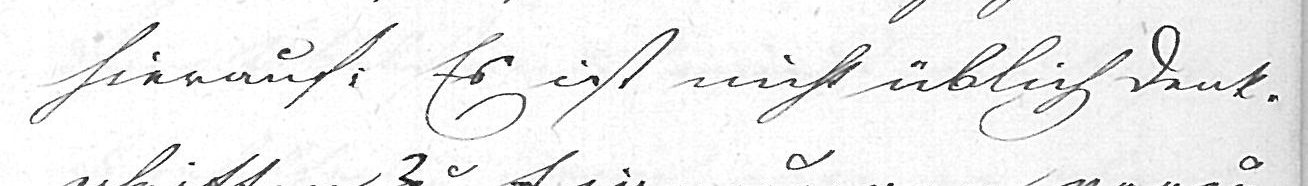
hierauf. Es ist nicht üblich Denk-
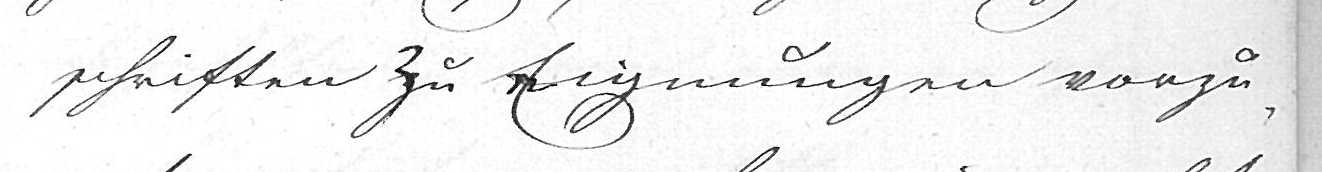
schriften Zu Eignungen vorzu-
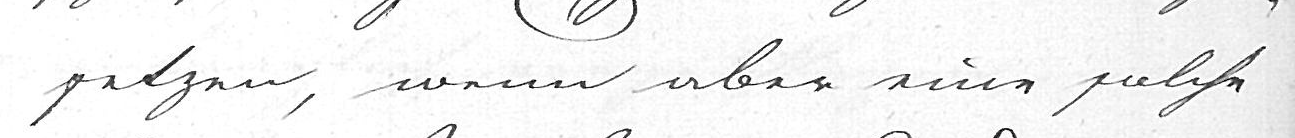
setzen, wenn aber eine solche
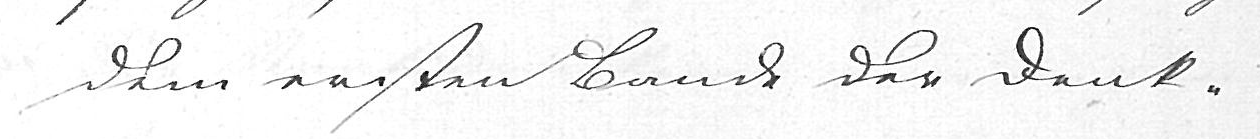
dem ersten Bande der Denk-
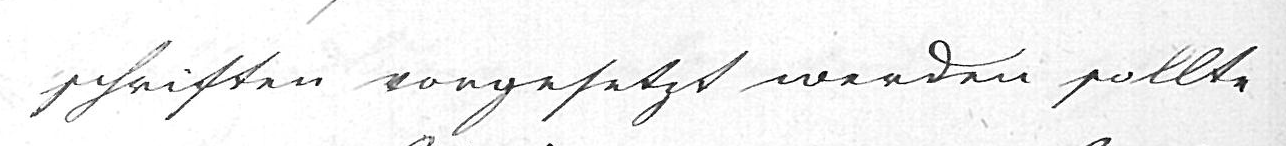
Schriften vorgesetzt werden sollte
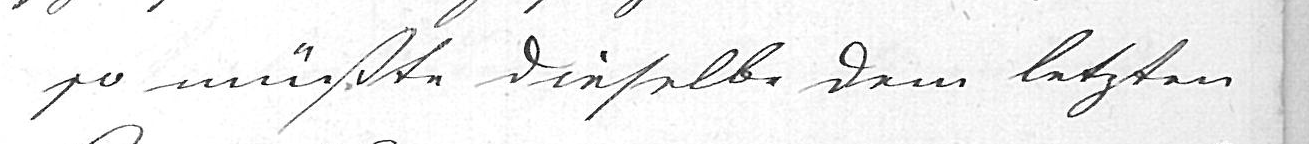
so müßte dieselbe dem letzten
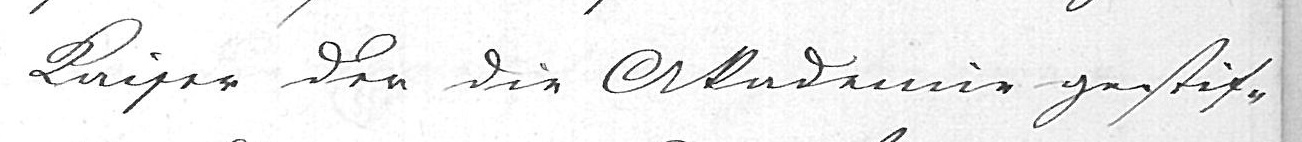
Kaiser der die Akademie gestif-
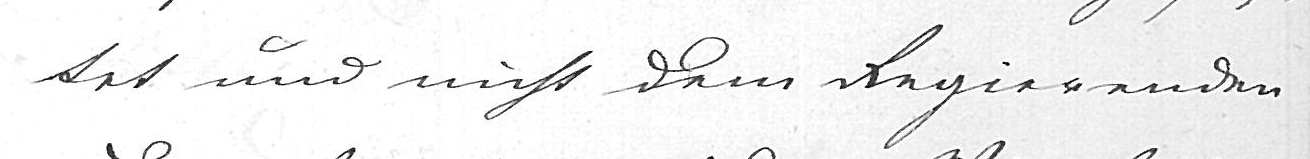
tet und nicht dem Regierenden
